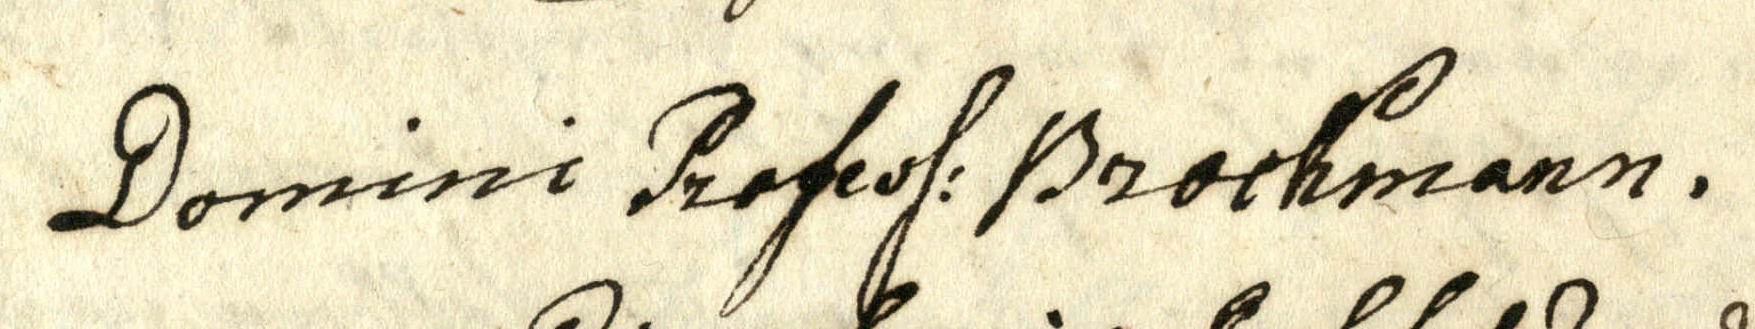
Domini Profess. Brockmann.
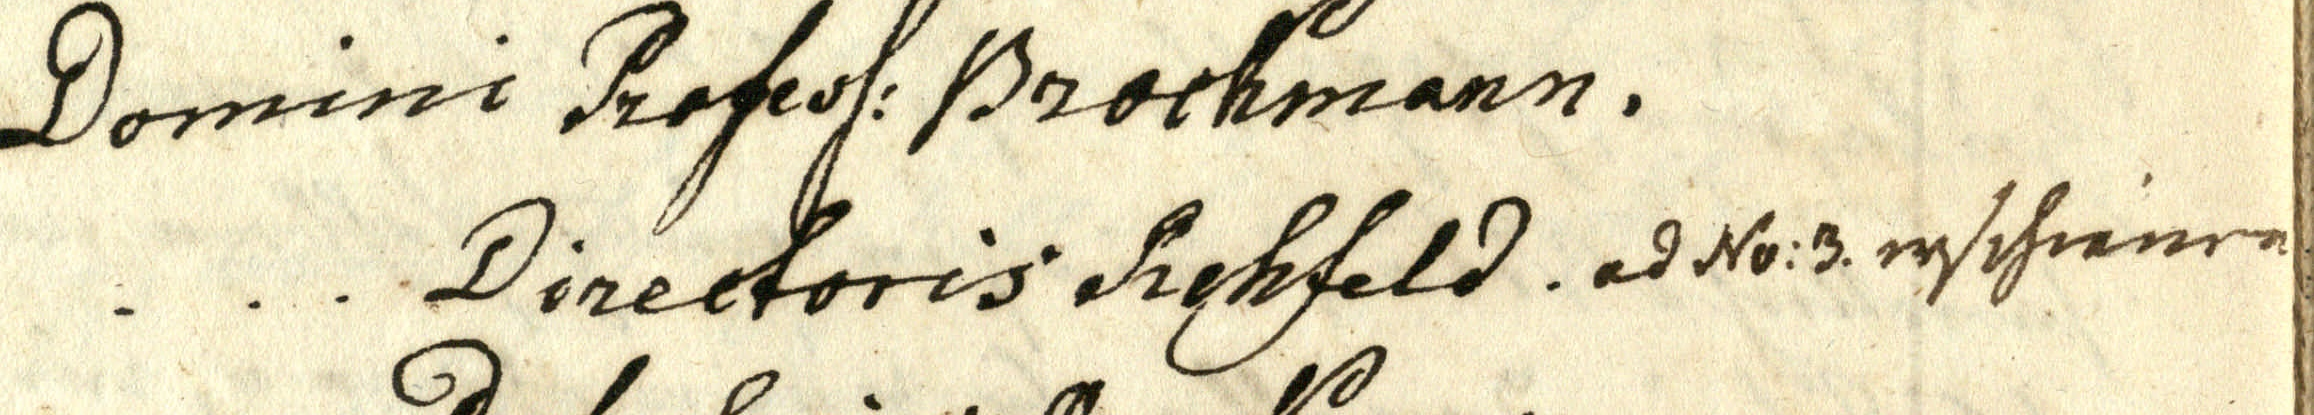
Directoris Rehfeld. ad No.3. erschienen
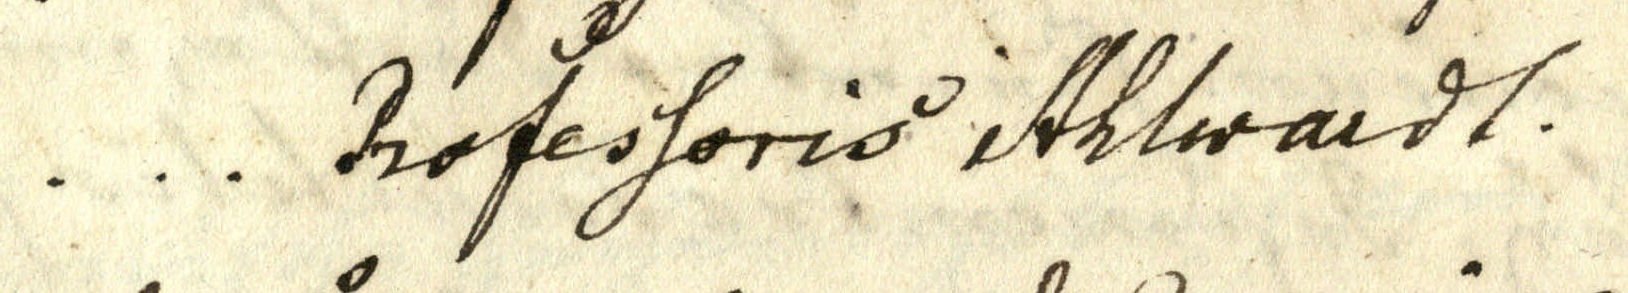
Professoris Ahlwardt.
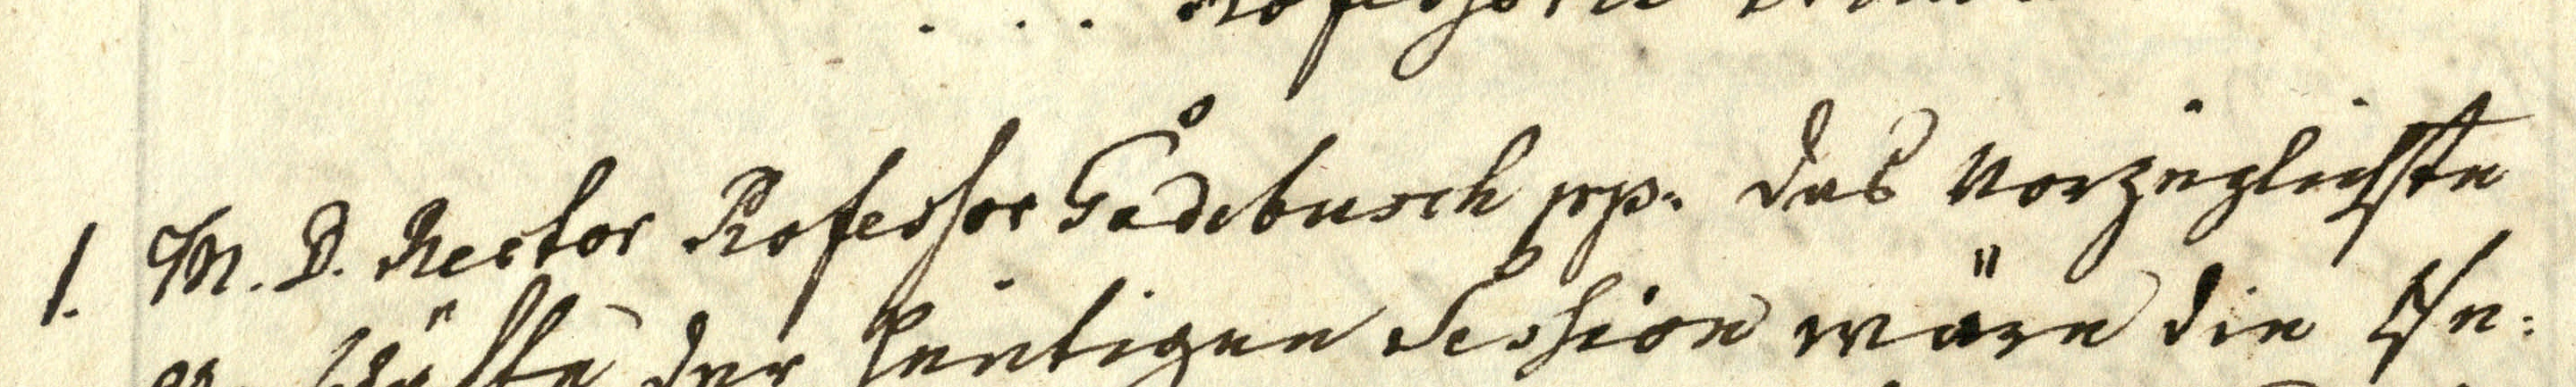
1. M. D. Rector Professor Gadebusch pp. das vorzüglichste
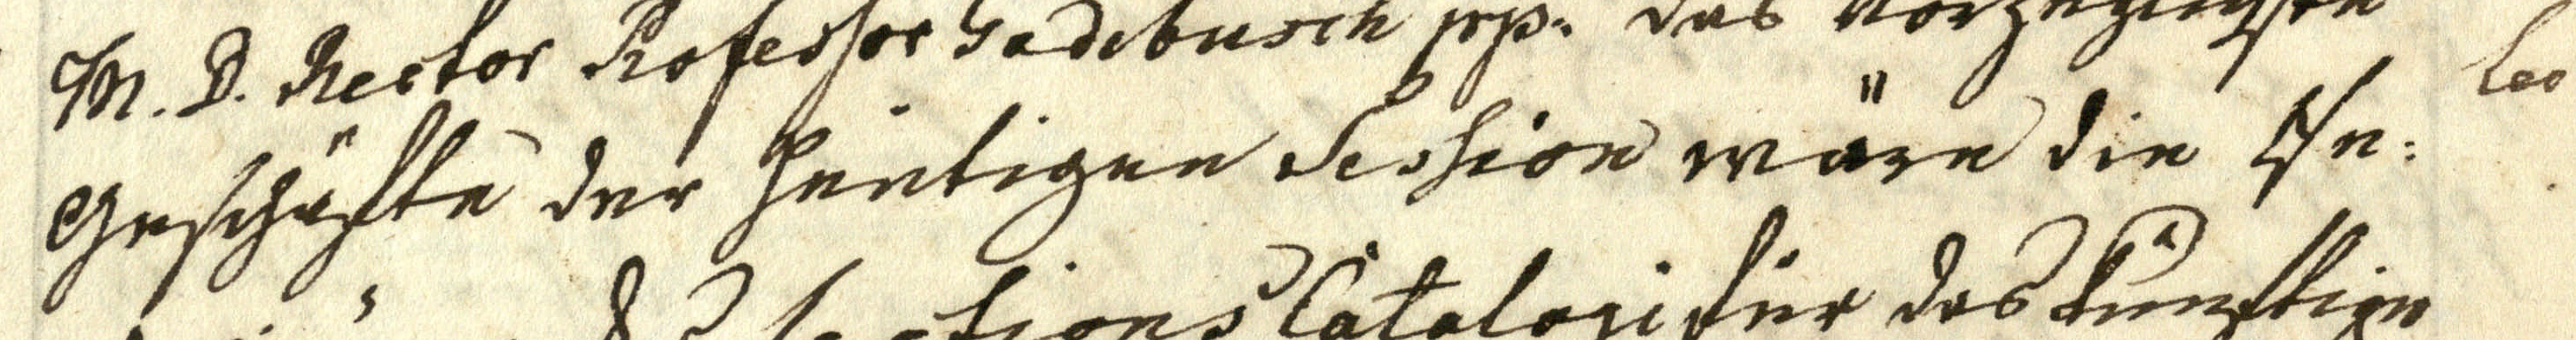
Geschäfte der heutigen Session wäre die Re¬
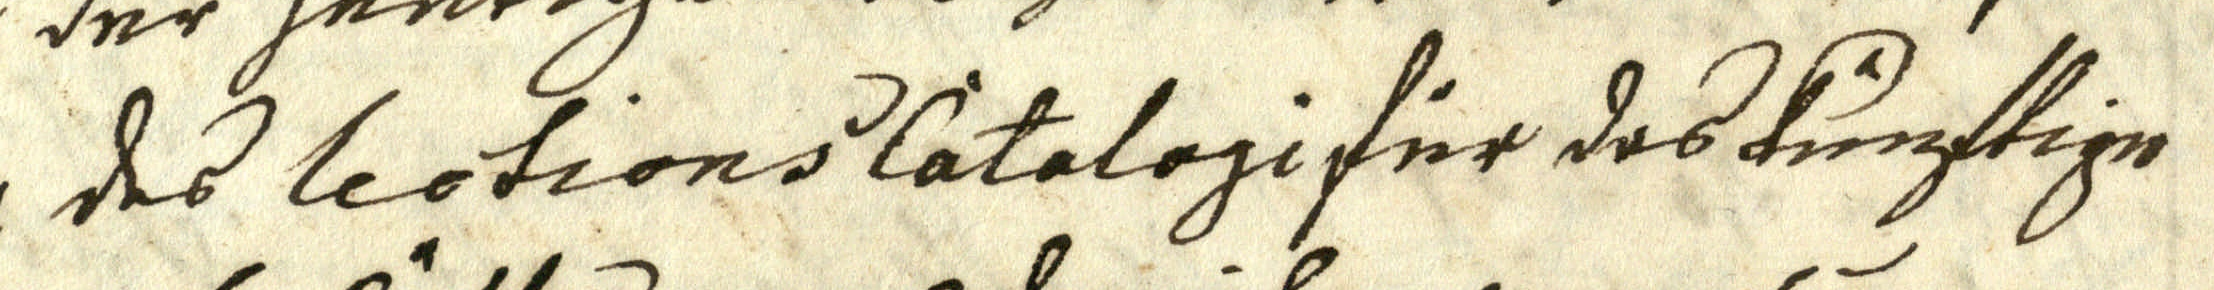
gulirung des lections Catalogi für das künftige
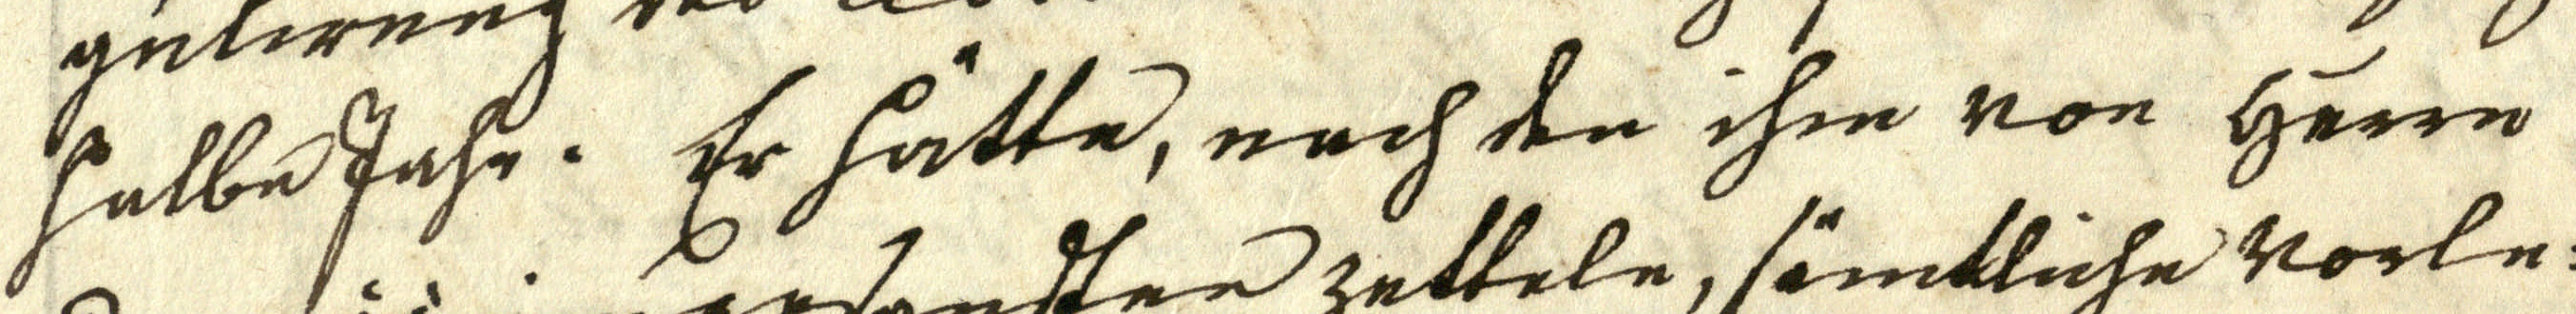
halbe Jahr. Er hätte, nach den ihm von Herrn
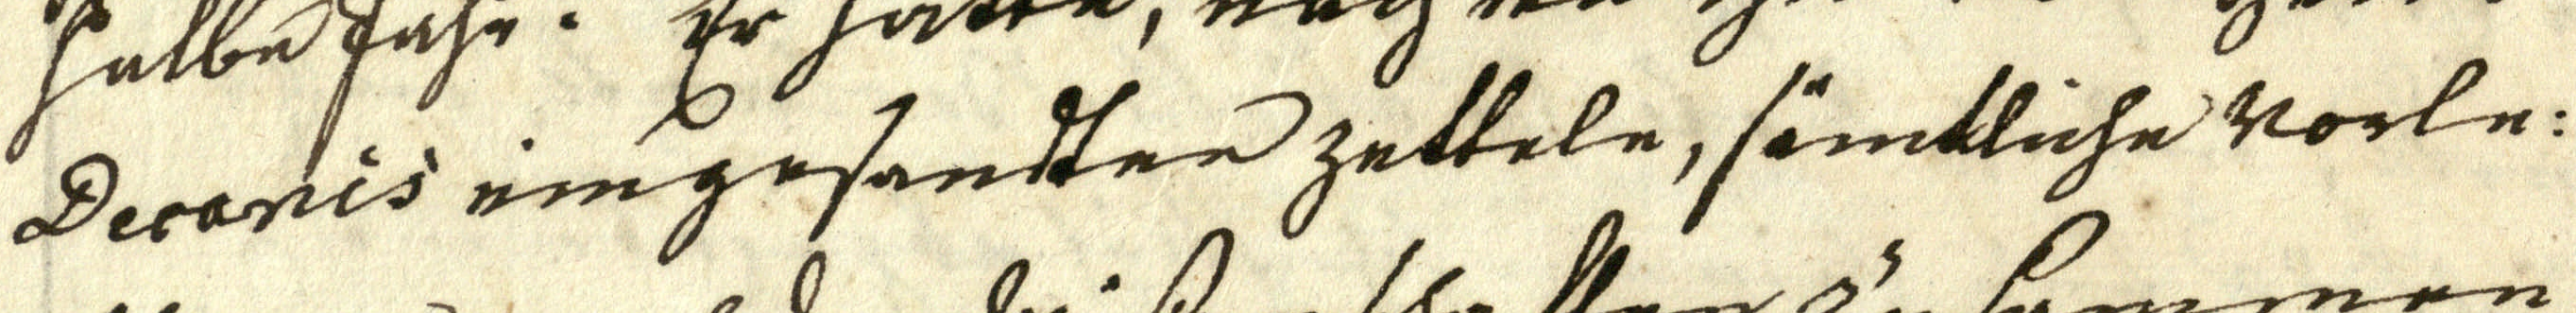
Decanis eingesandten zetteln, sämtliche Vorle¬¬
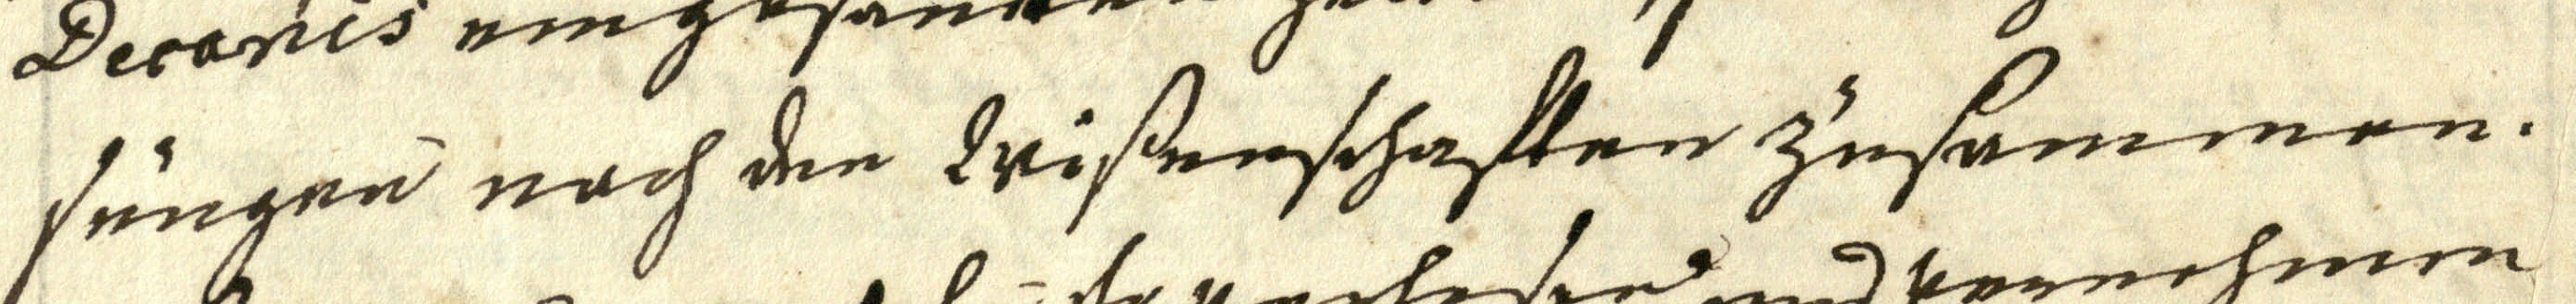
sungen nach den Wißenschaften zusammen¬
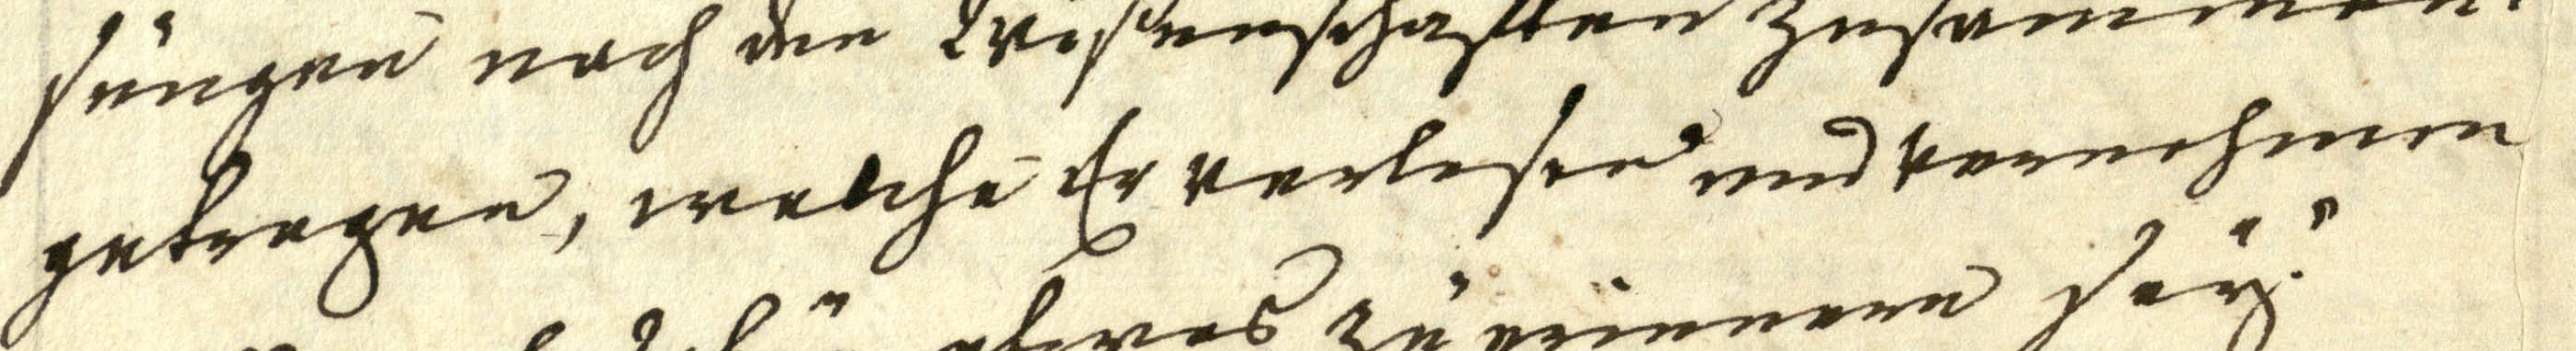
getragen, welche Er verlesen und vernehmen
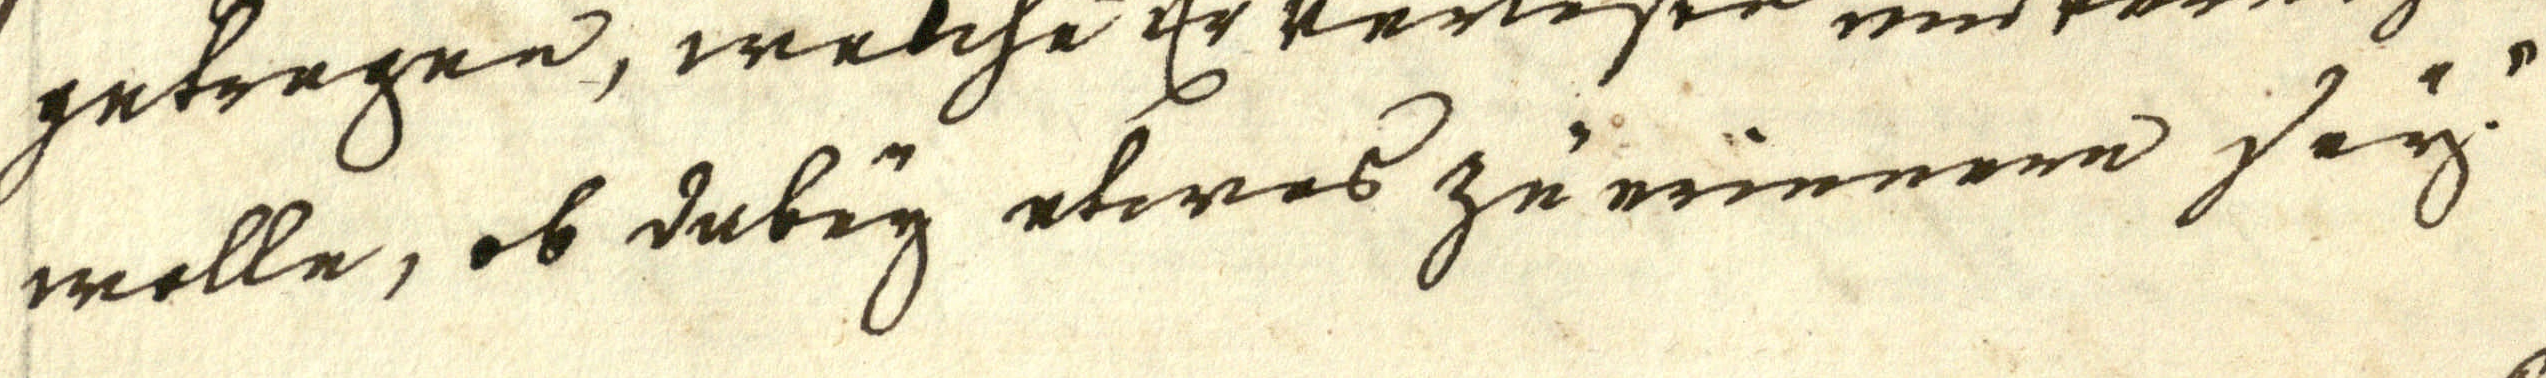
wolle, ob dabeÿ etwas zu erinnern seÿ?
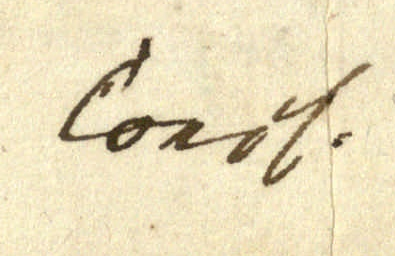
Concl.
